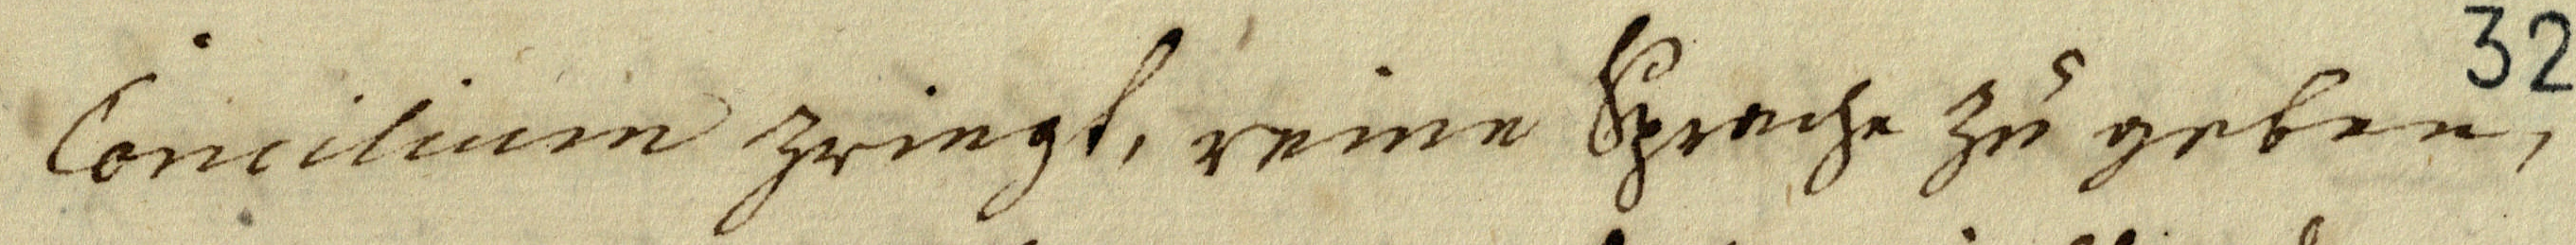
Concilium zwingt, reine Sprache zu geben,
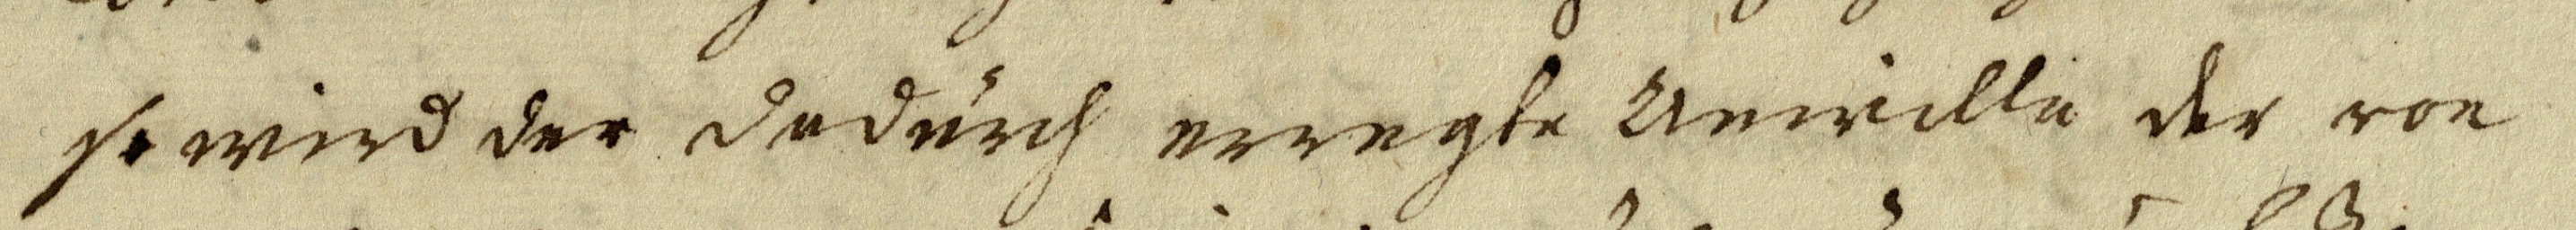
so wird der dadurch erregte Unwille der von
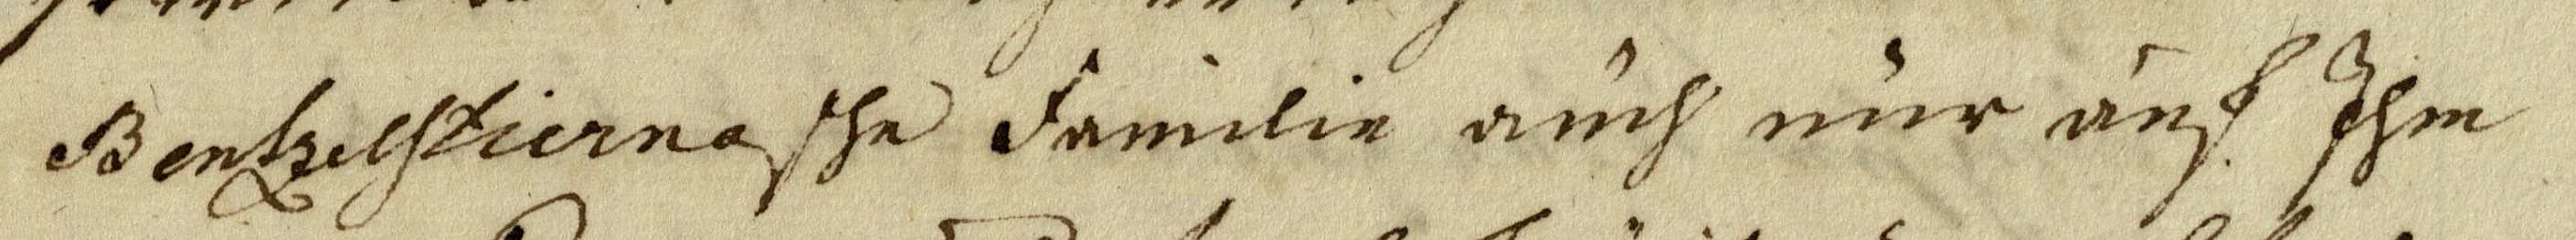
Bentzelstiernasche Familie auch nur auf Ihm
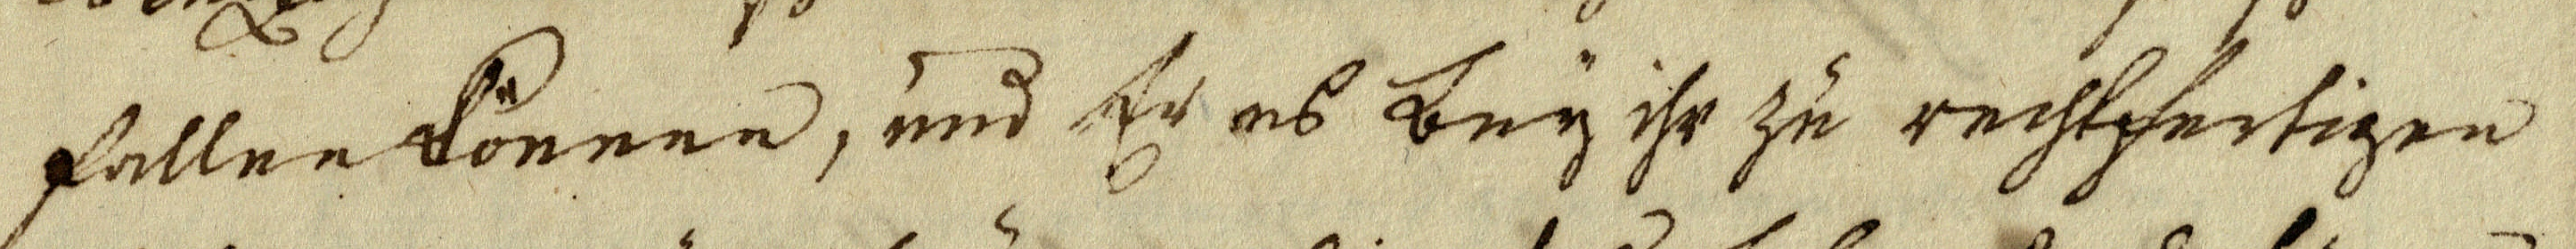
fallen können, und Er es beÿ ihr zu rechtfertigen
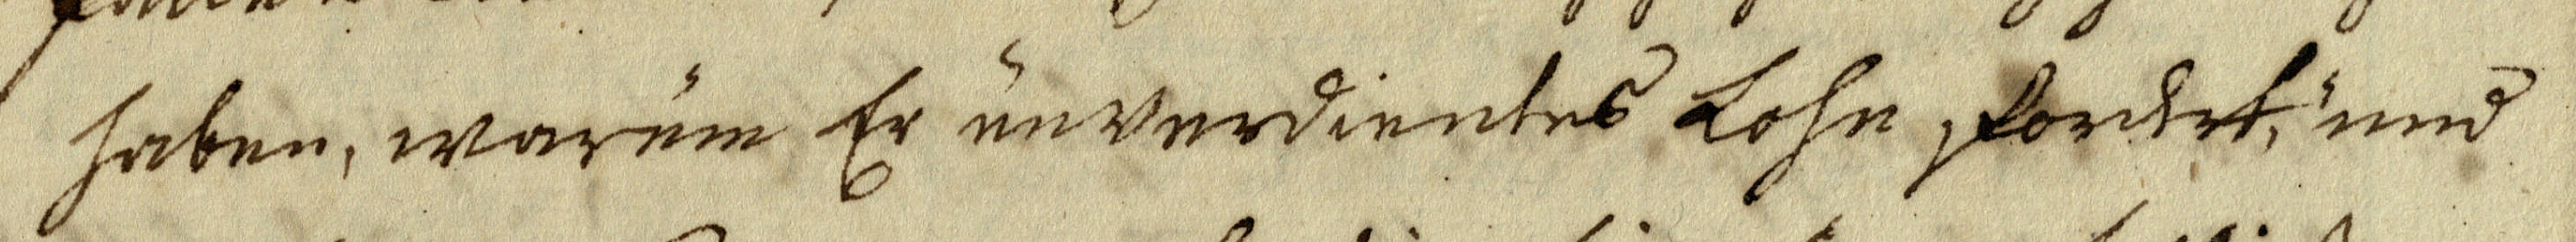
haben, warum Er unverdientes Lohn fordert, und
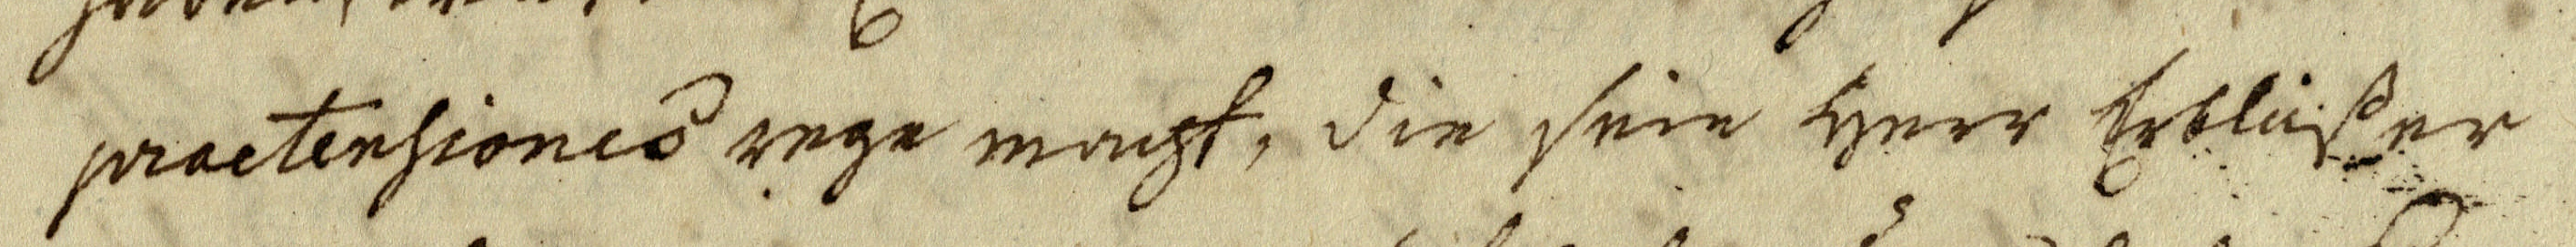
praetensiones rege macht, die sein Herr Erblaßer
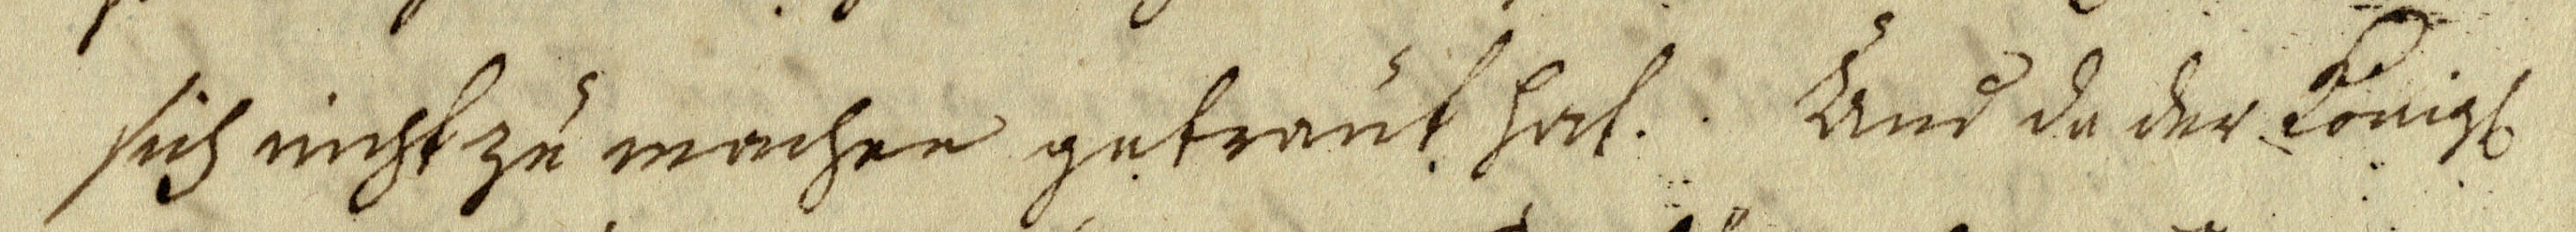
sich nicht zumachen getraut hat. Und da der Königl.
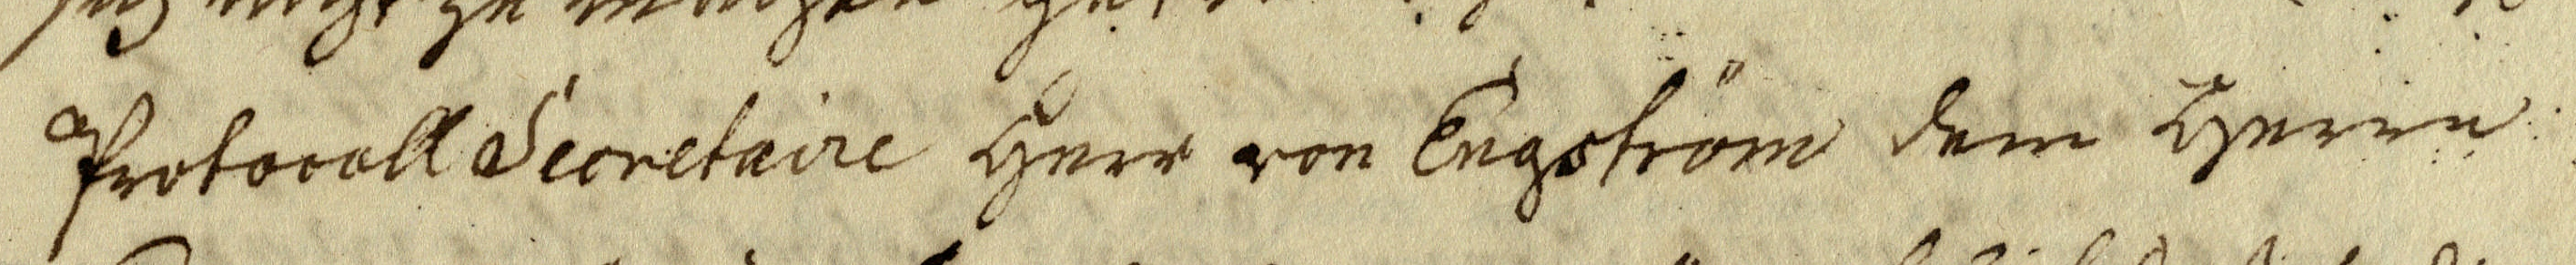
Protocoll Secretaire Herr von Engström dem Herrn
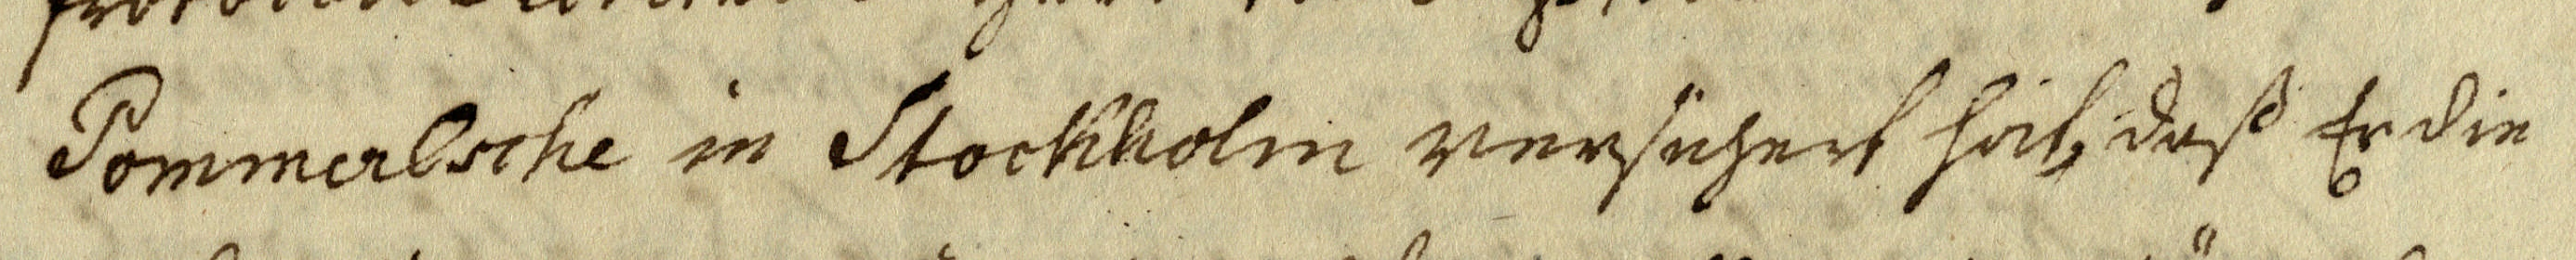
PommerEsche in Stockholm versichert hat, daß Er die
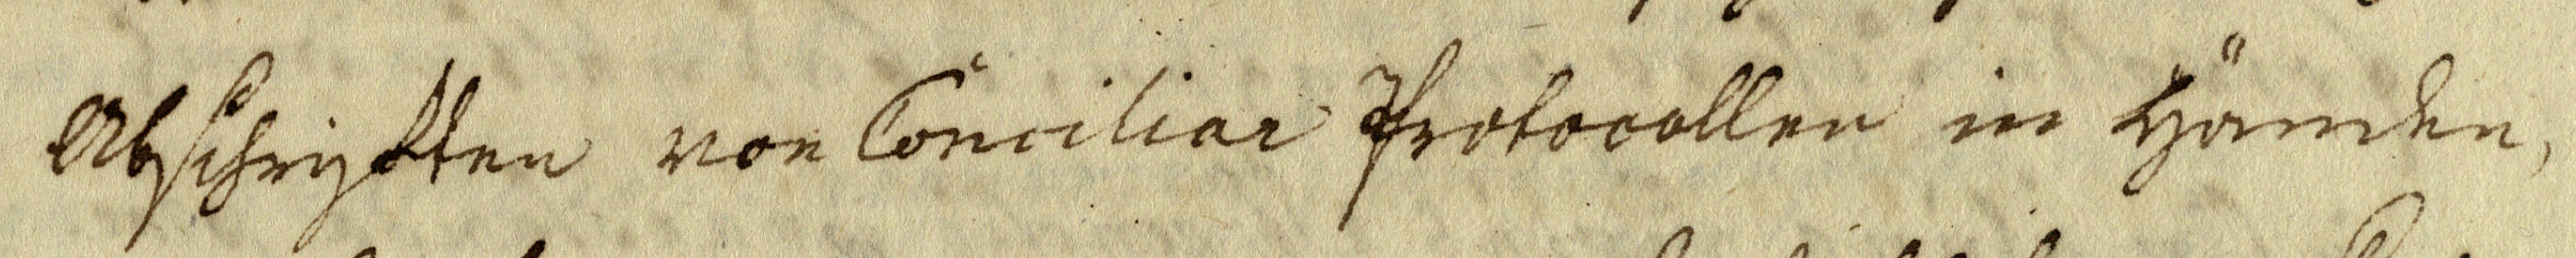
Abschriften von Conciliar Protocollen in Händen,
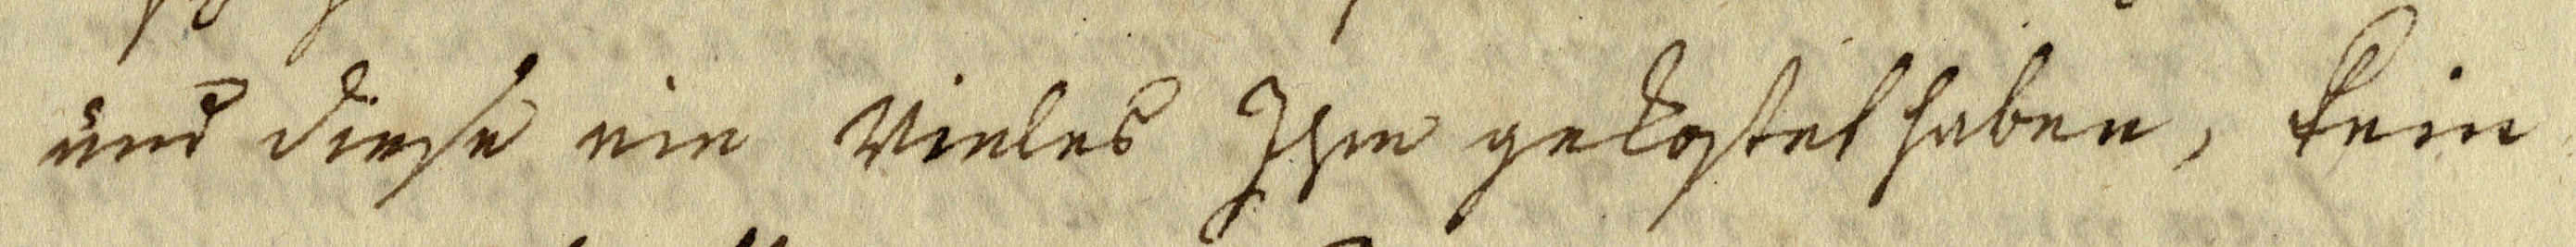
und diese ein vieles Ihm gekostet haben, kein
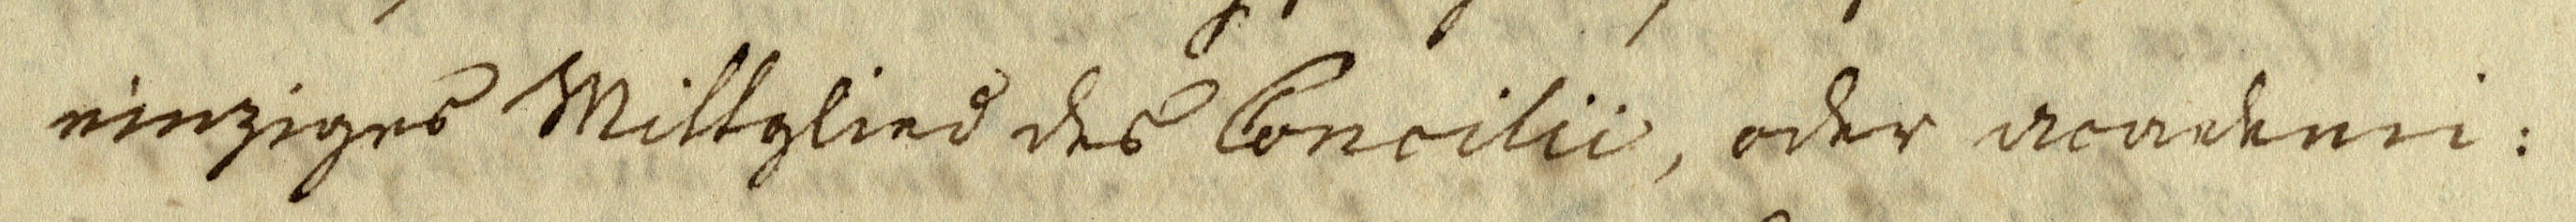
einziges Mittglied des Concilii, oder academi¬
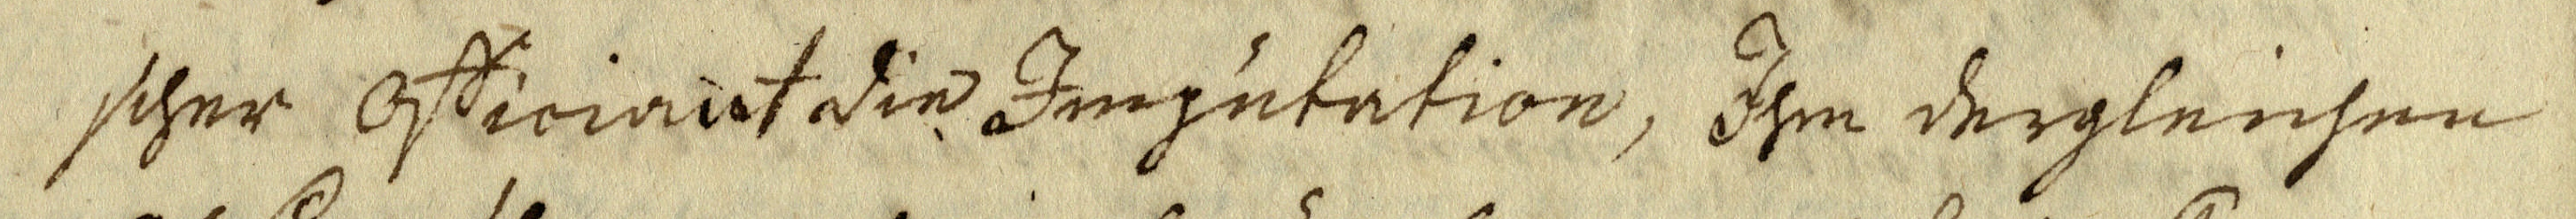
scher officiant die Imputation, Ihm dergleichen
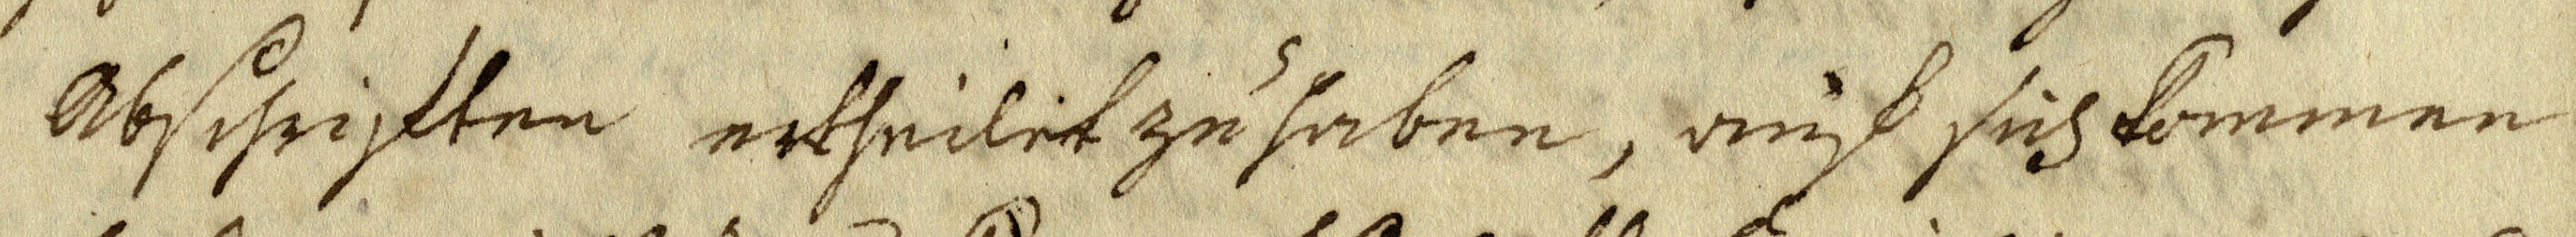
Abschriften ertheilet zu haben, auf sich kommen
